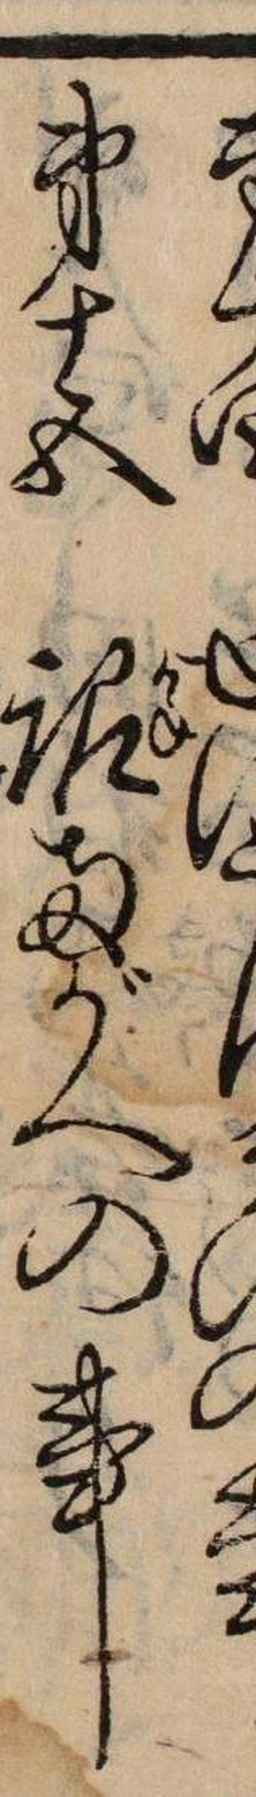第十五銀両がへの事
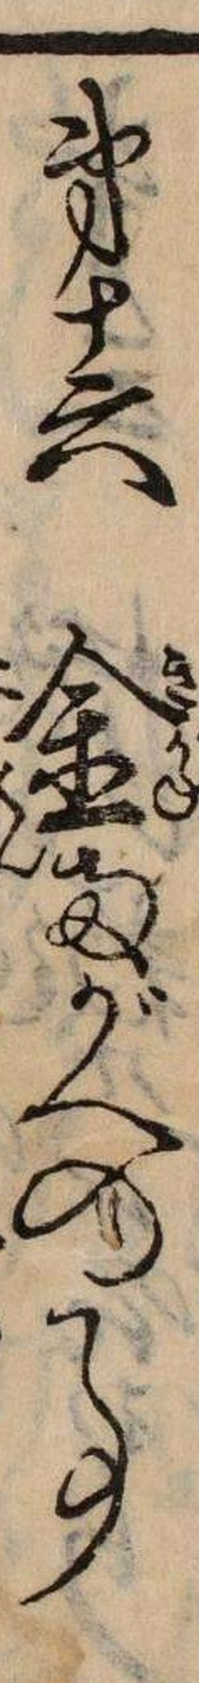第十六金両がへの事
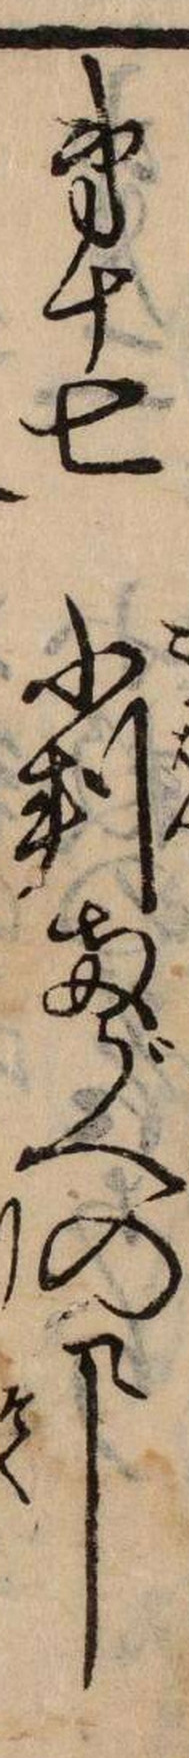第十七小判両がへの事
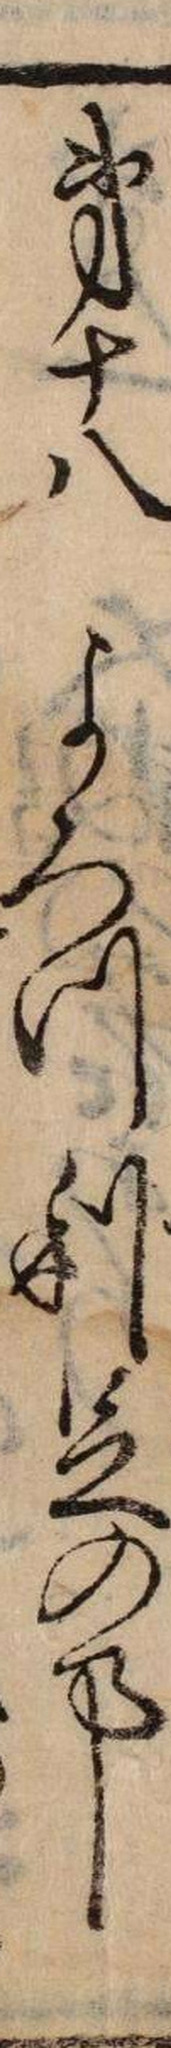第十八よろつ利足の事
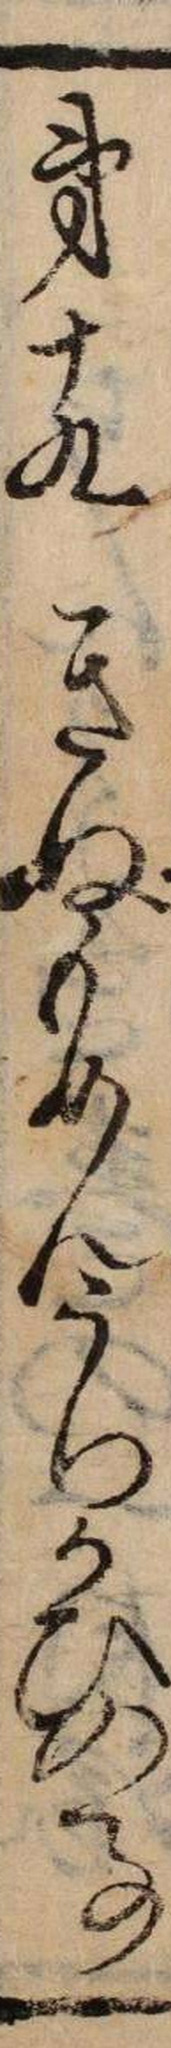第十九きぬもめんうりかひの事

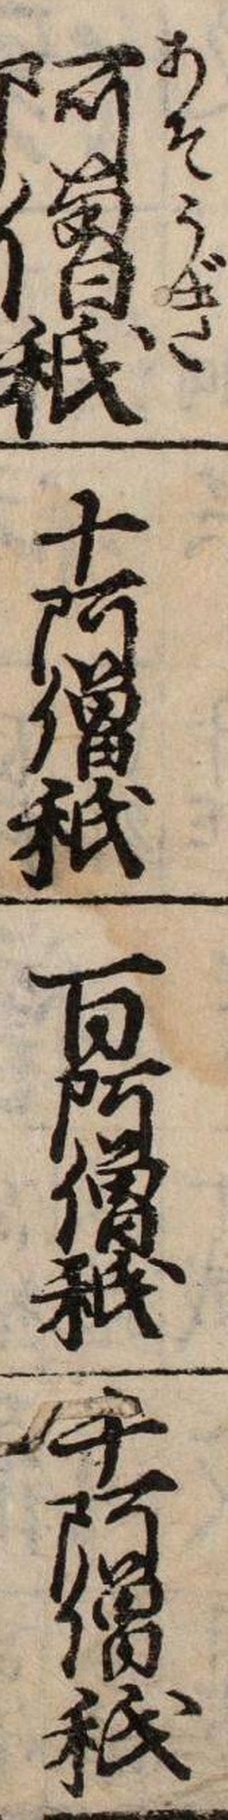阿僧秖十阿僧秖百阿僧秖千阿僧秖
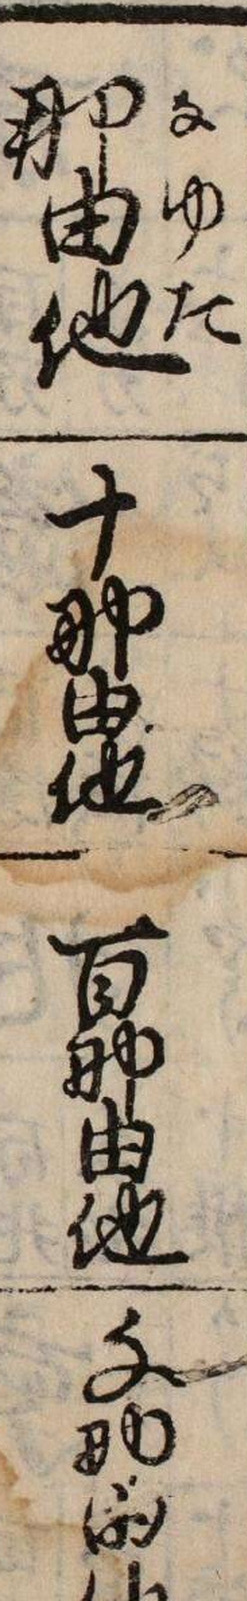那他十那由他百那由他千那由他
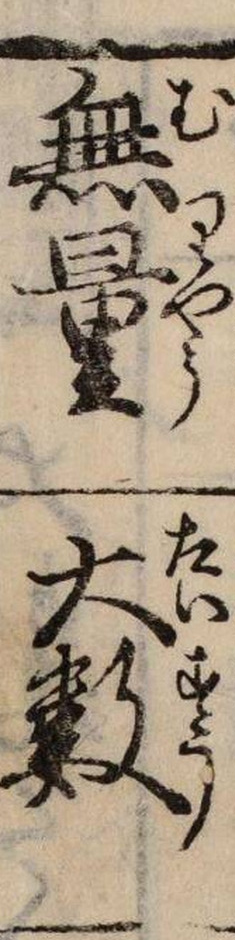無量大数

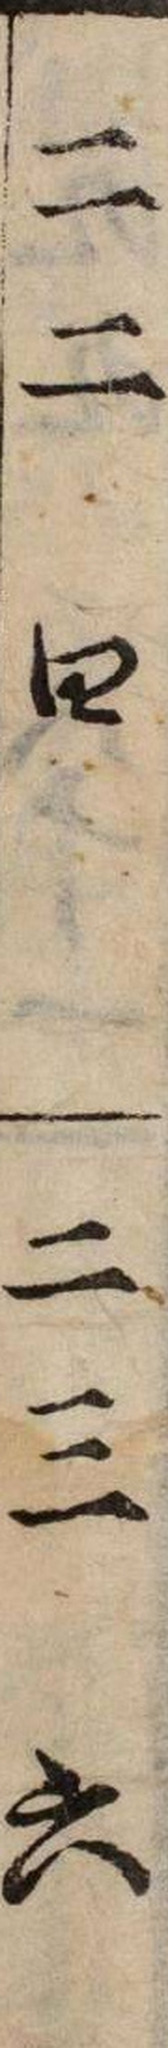二二四二三六
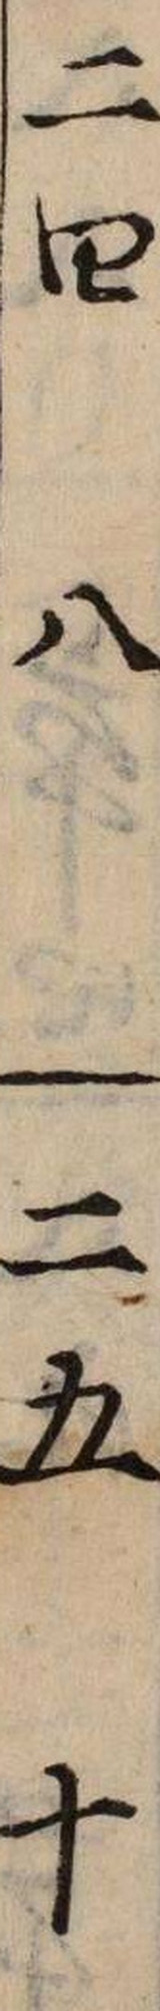二四八二五十
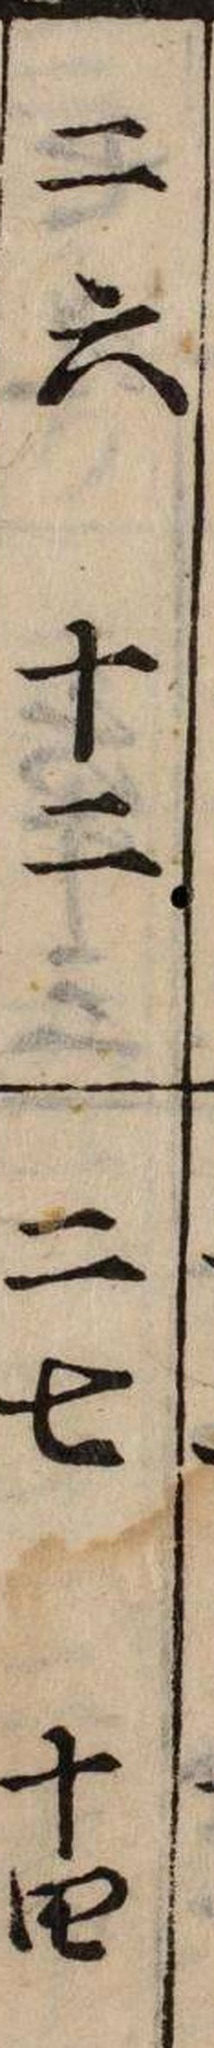二六十二二七十四
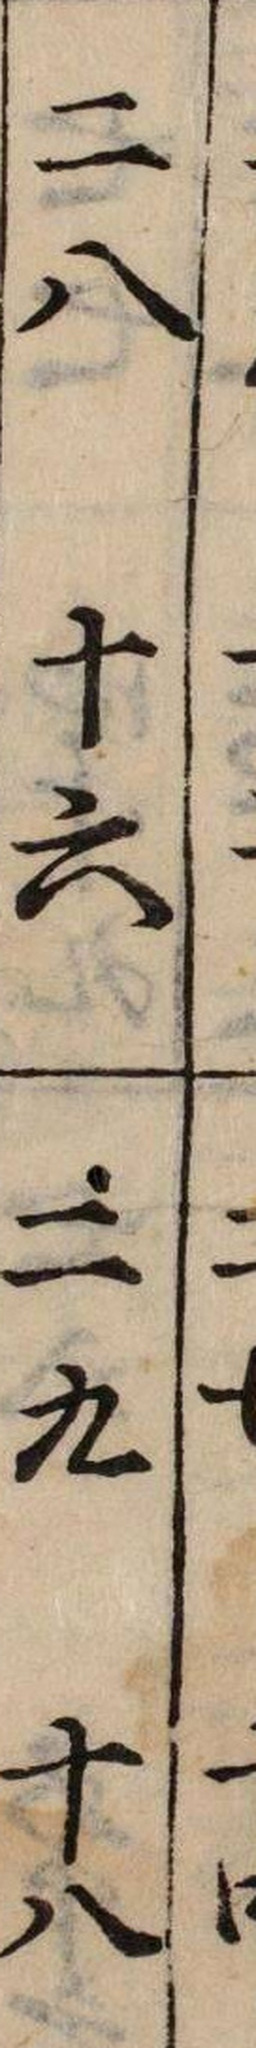二八十六二九十八
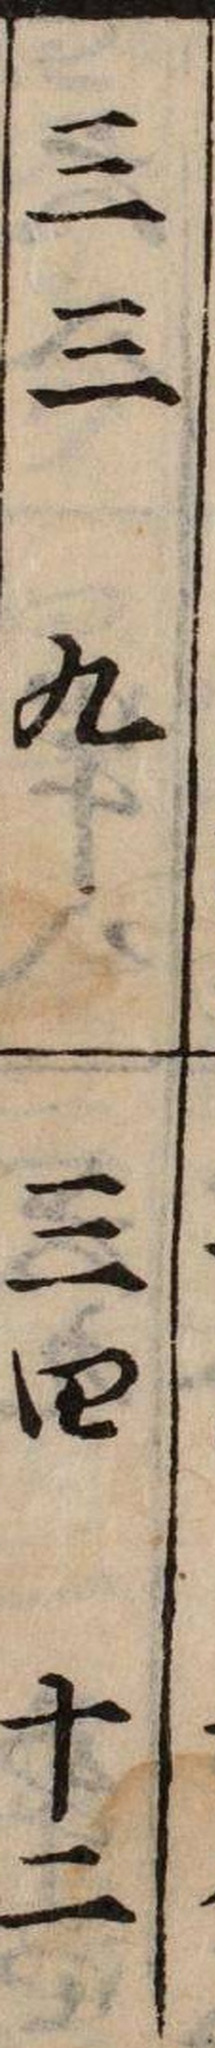三三九三四十二
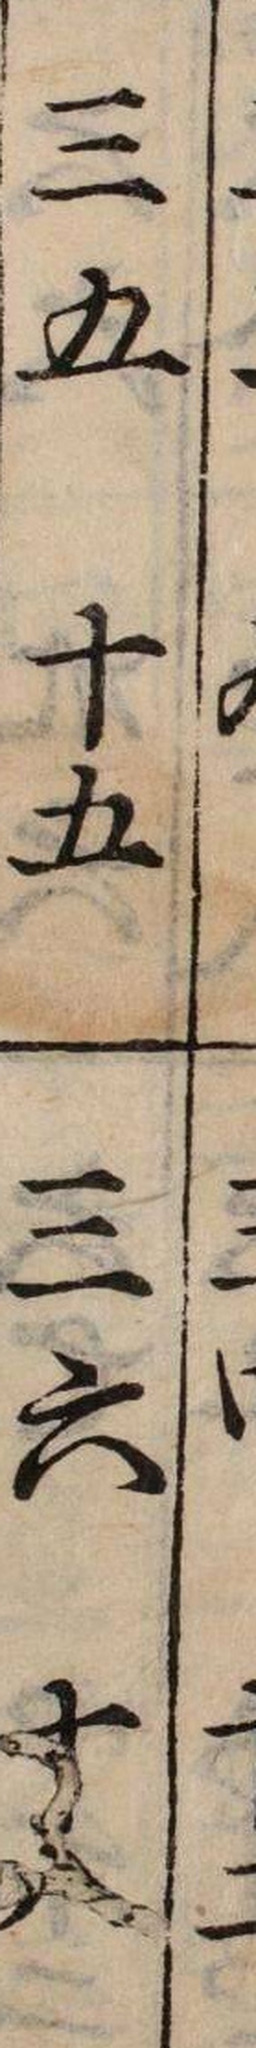三五十五三六十八
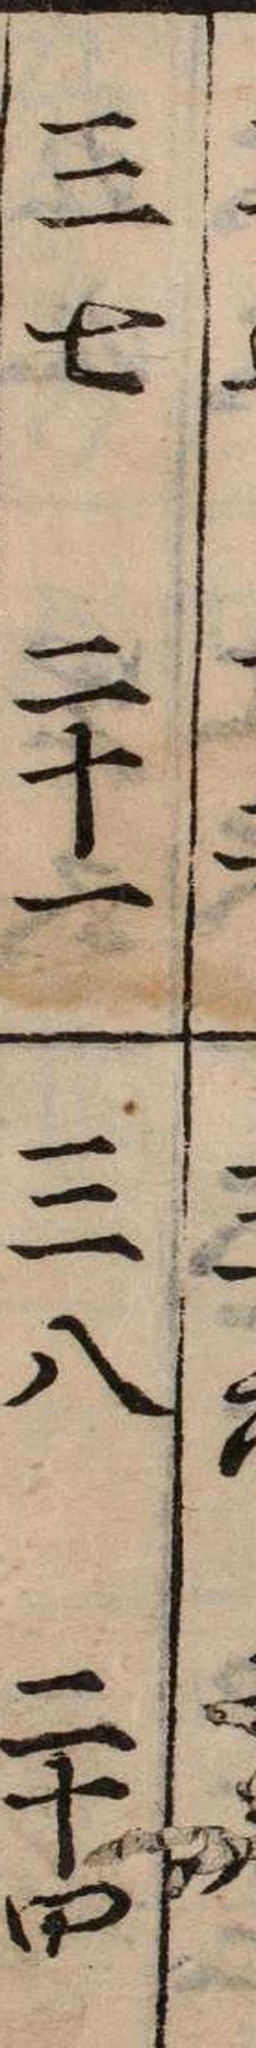三七二十一三八二十四
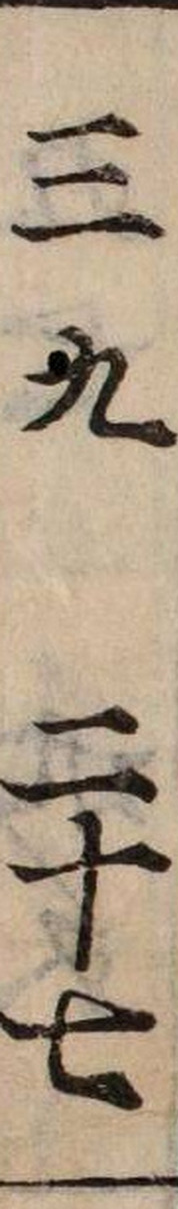三九二十七
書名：塵劫記（寛永11年自跋、京都府立京都学・歴彩館追貴8）
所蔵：京都府立京都学・歴彩館 国文学研究資料館
